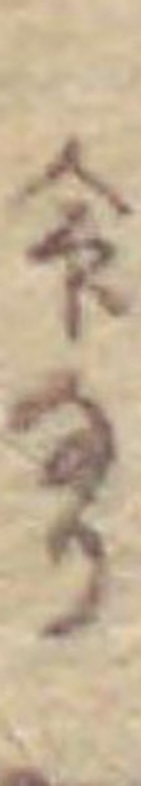命なり
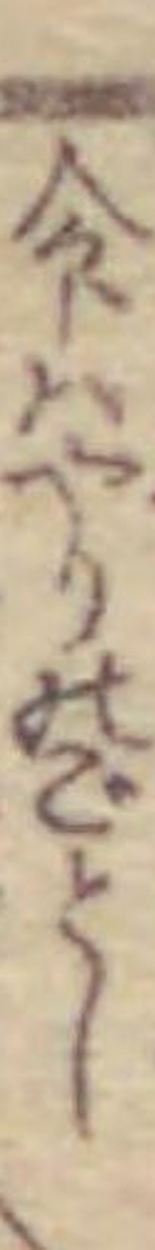命はやりのごとし
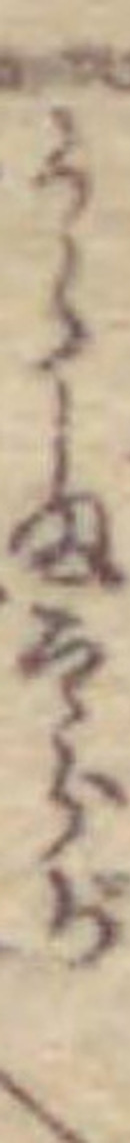うらしま太郎が
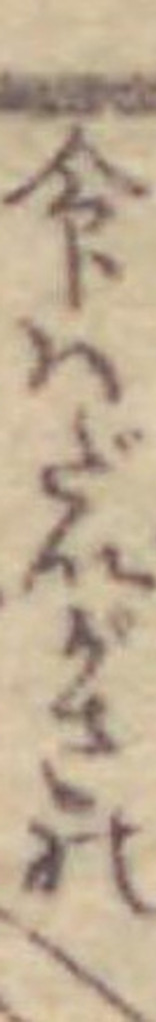命はだいがさの
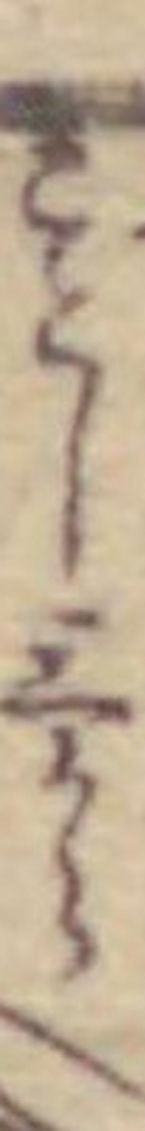ことし三から
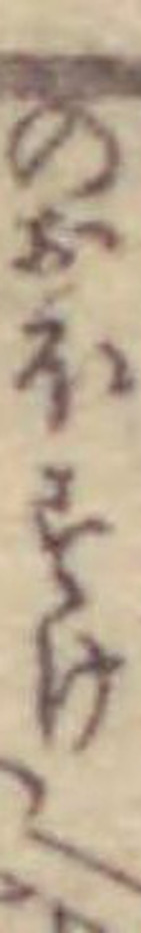のおほすけ
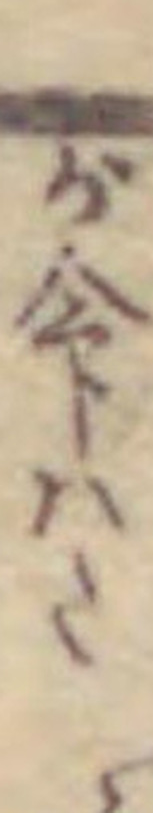が命はた
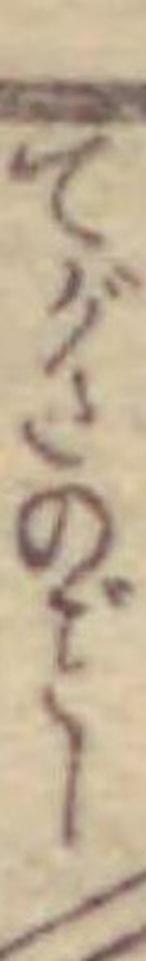てがたのごとし
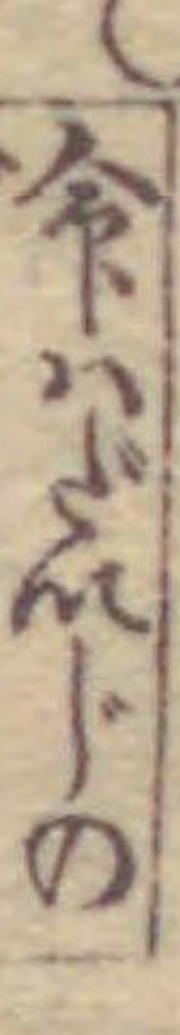命はだいがさの
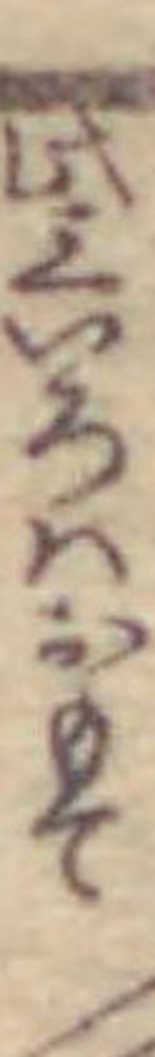此三いろはおもて
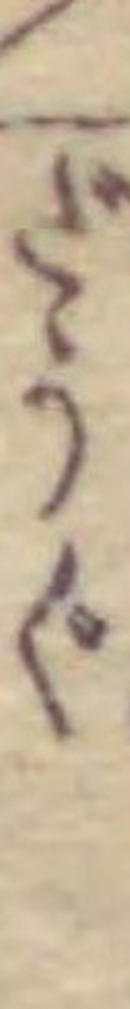だうぐ
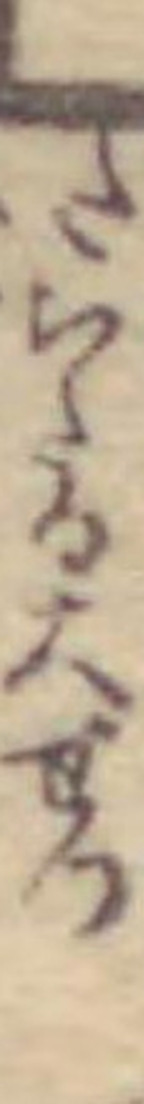たちたる大せつ
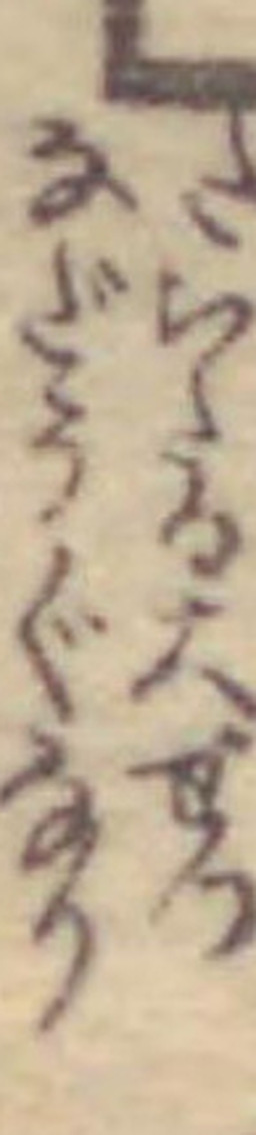なだうぐなり
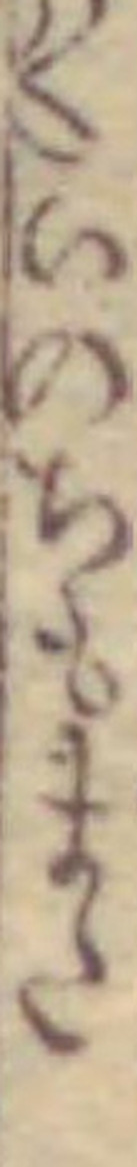いのちもまた
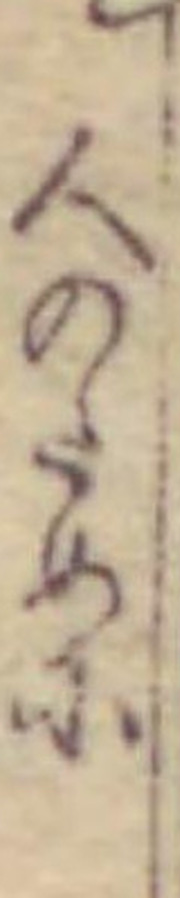人のために
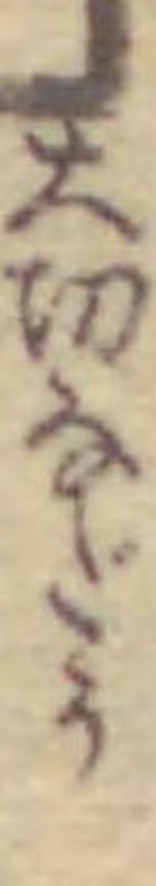大切なだう
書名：御誂染長寿小紋 : 3巻
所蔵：国立国会図書館 National Diet Library, JAPAN
